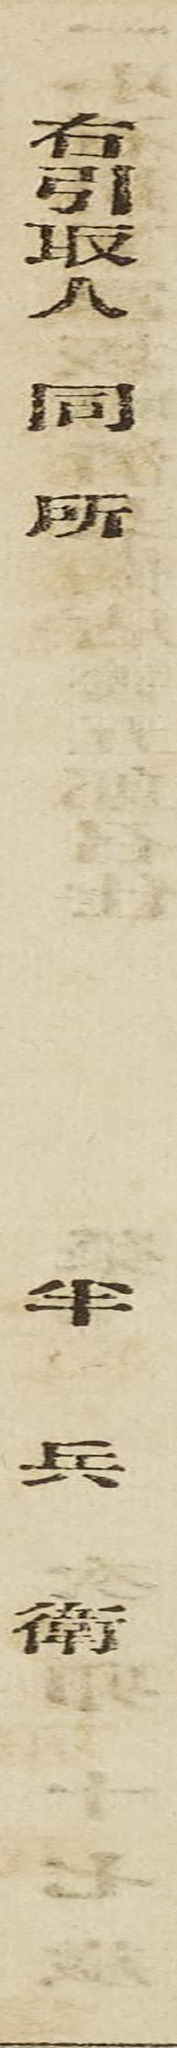右引取人同所半兵衛
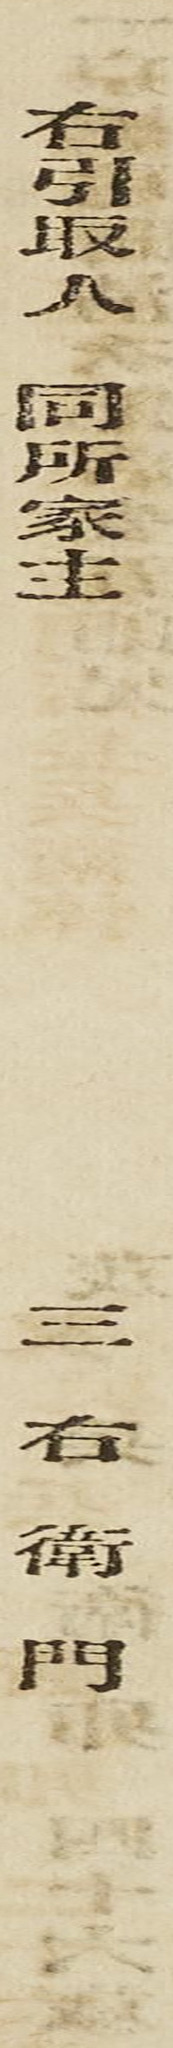右引取人同所家主三右衛門
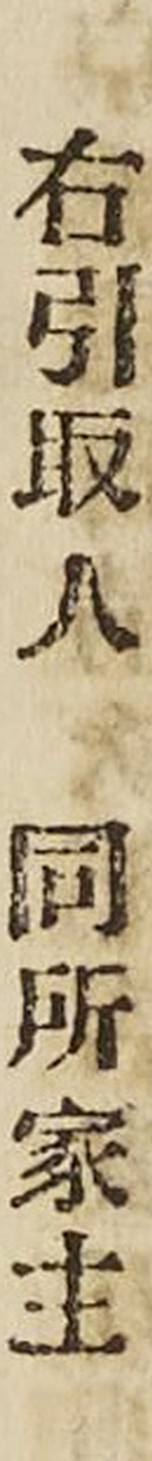右引取人同所佐七
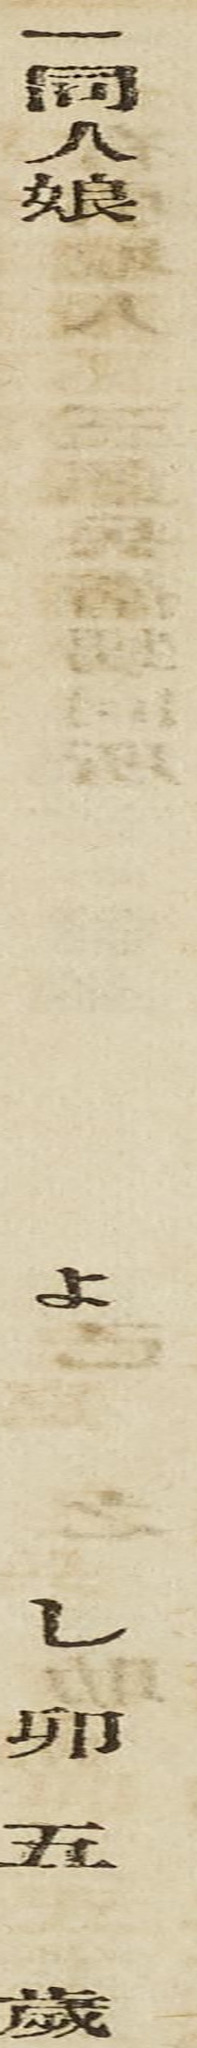一同人娘よし卯五歳
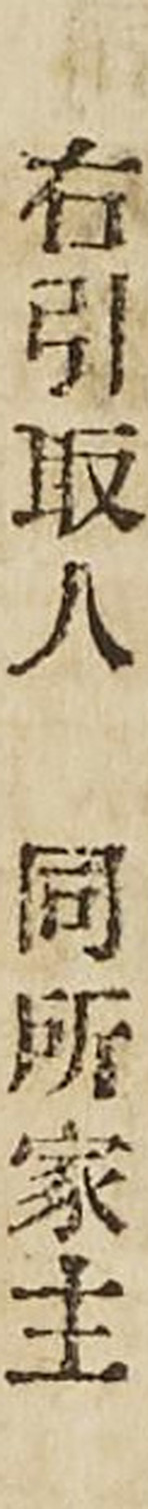右引取人同所佐七
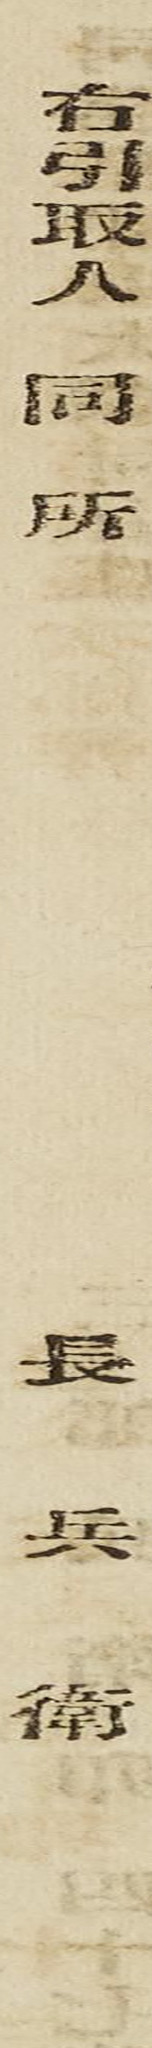右引取人同所長兵衛
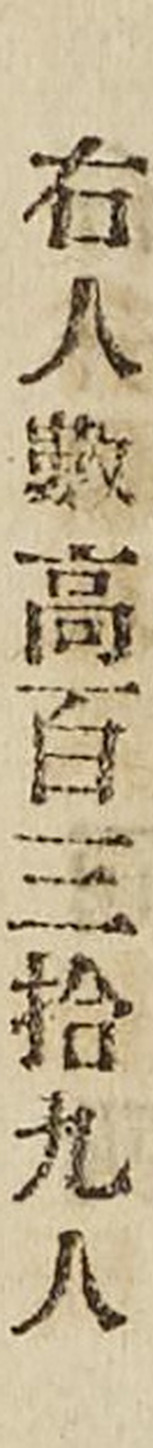右人数高百三拾九人
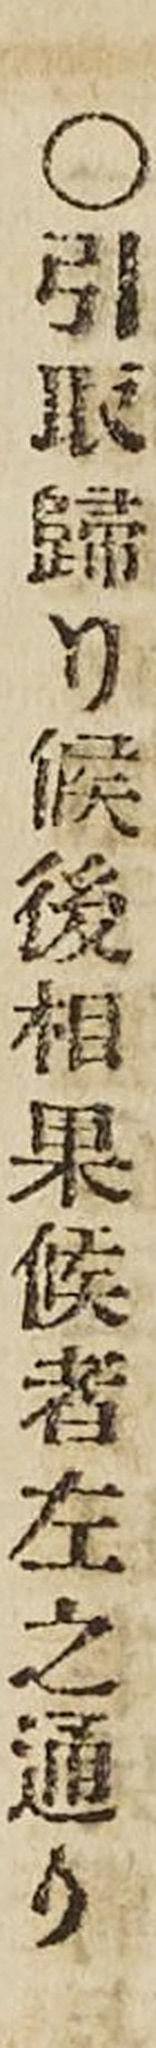〇引取帰り候後相果候者左之通り
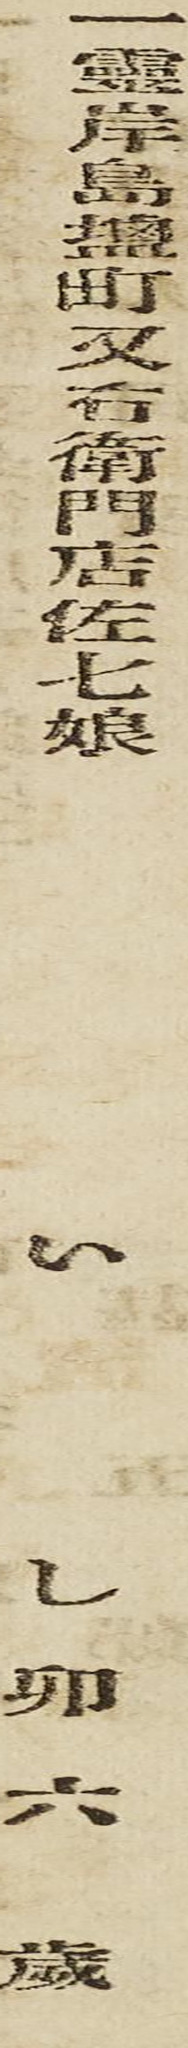一霊岸島塩町又右衛門店佐七娘いし卯六歳
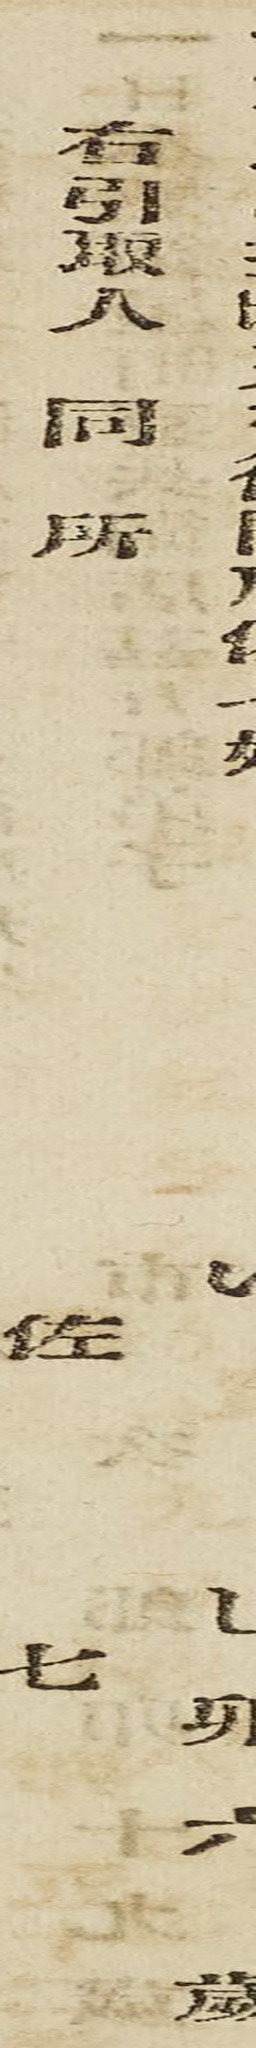右引取人同所佐七
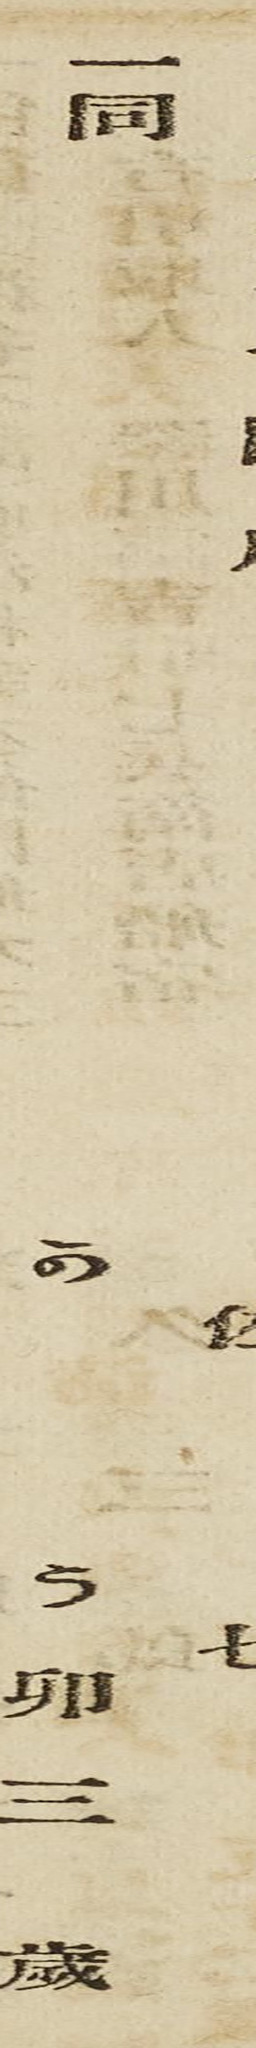一同かう卯三歳
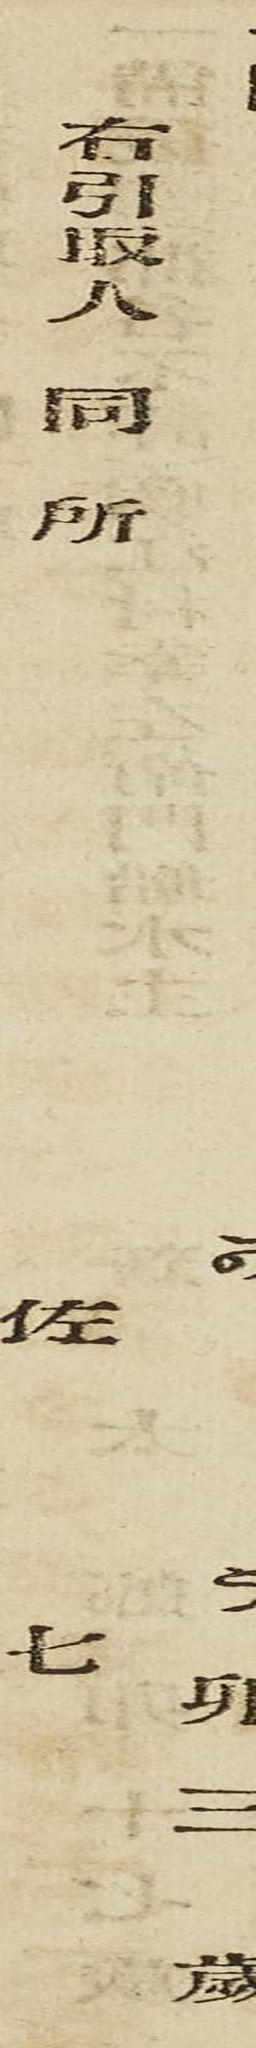右引取人同所佐七
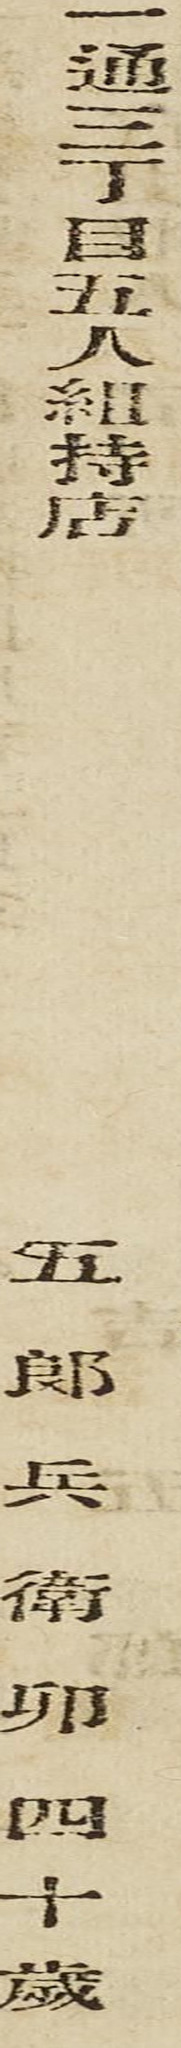一通三丁目五人組持店五郎兵衛卯四十歳
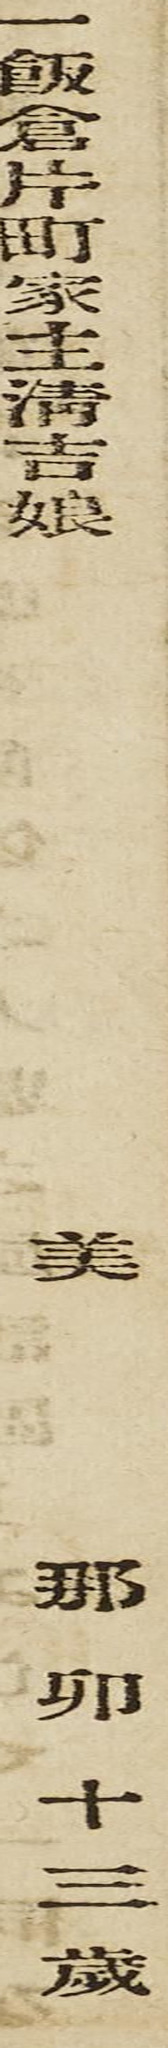一飯倉片町家主清吉娘美那卯十三歳
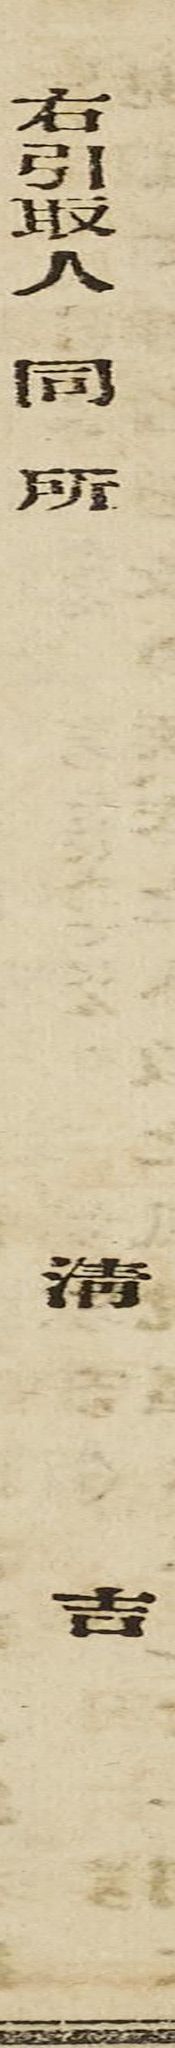右引取人同所清吉
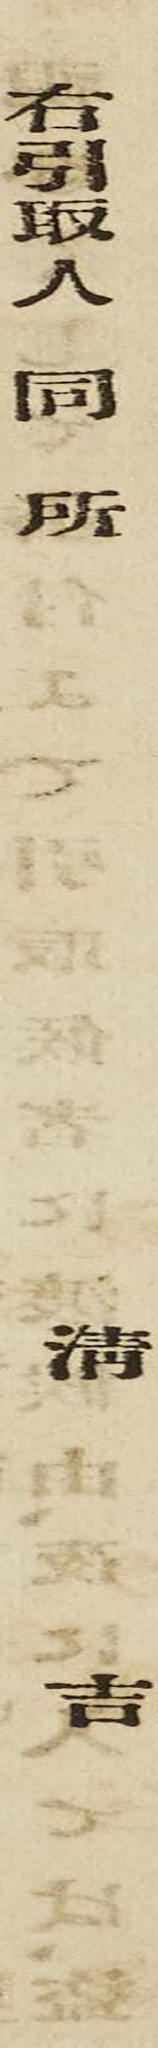右引取人同所清吉
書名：永代惨話　文化の夢　全
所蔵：東京大学地震研究所図書室 Earthquake Research Institute Library, The University of Tokyo, JAPAN
